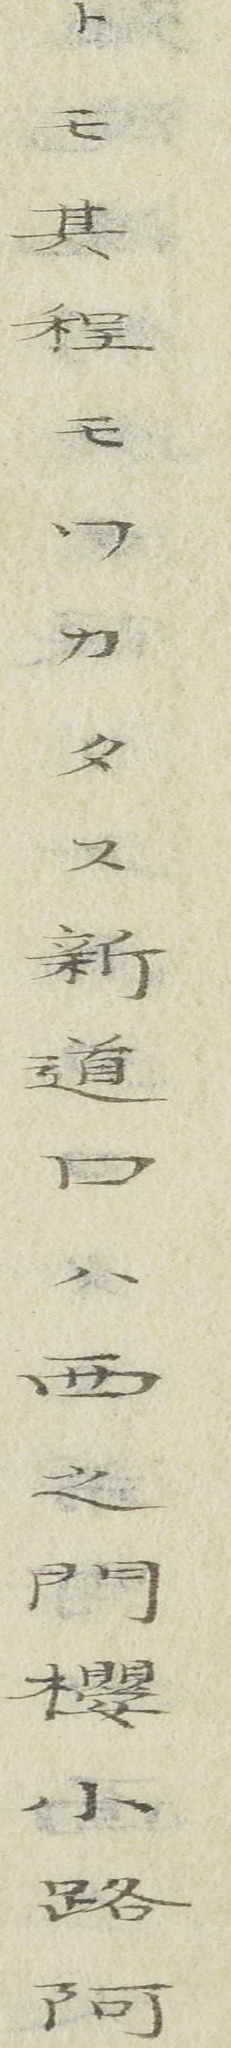トモ其程モワカタス新道口ハ西之門桜小路阿

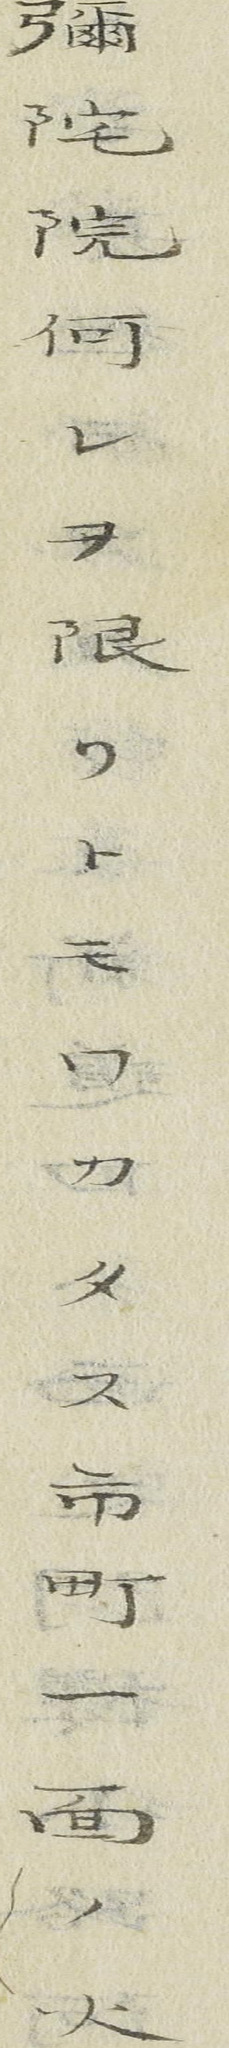弥陀院何レヲ限リトモワカタス市町一面ノ火
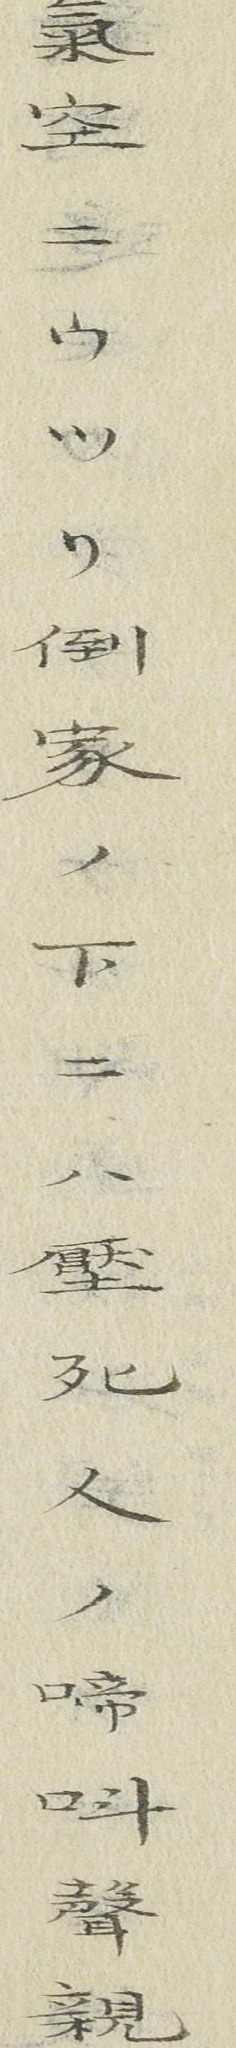気空ニウツリ倒家ノ下ニハ圧死人ノ啼叫声親
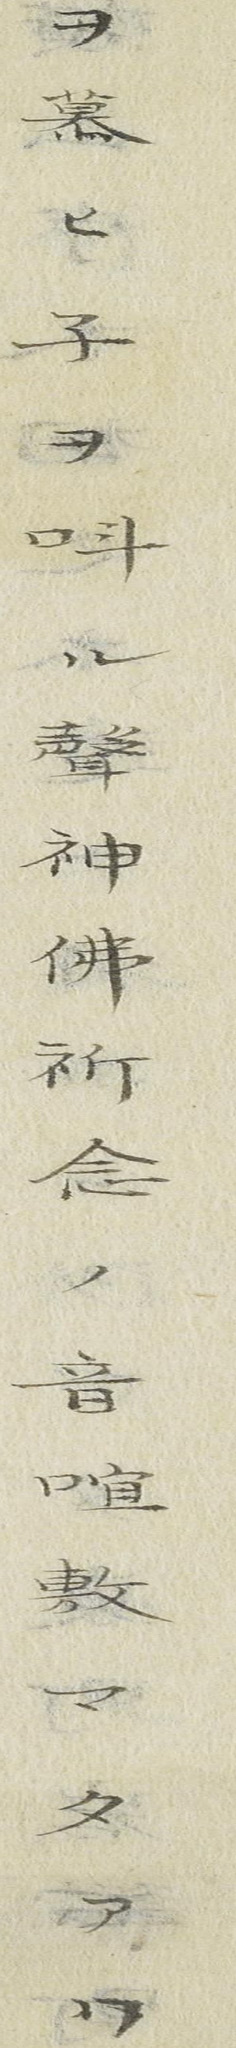ヲ慕ヒ子ヲ叫ル声神仏祈念ノ音喧敷マタアワ
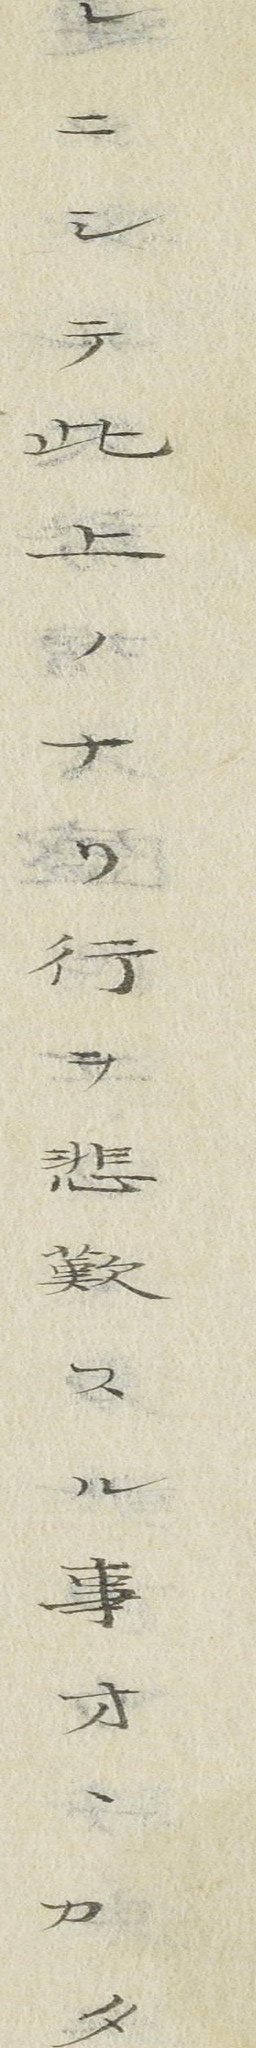レニシテ此上ノナリ行ヲ悲歎スル事オヽカタ
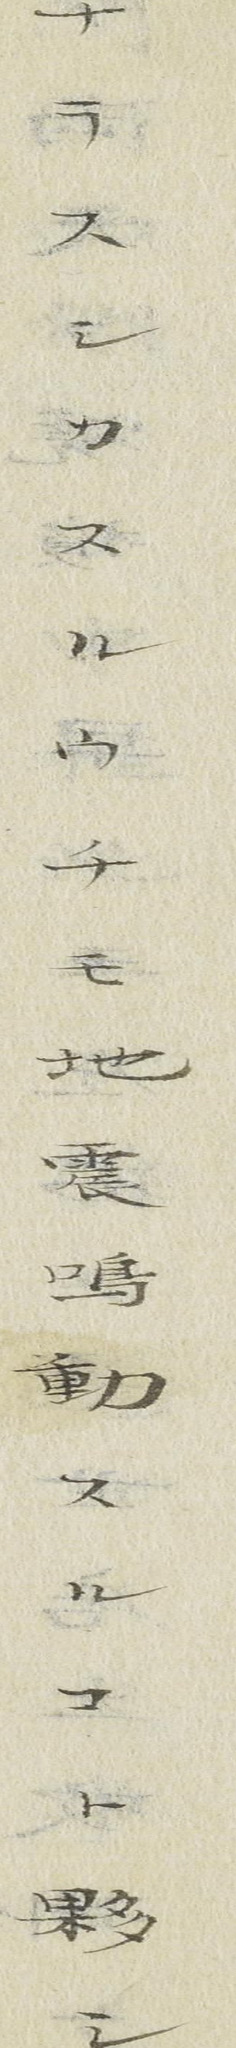ナラスシカスルウチモ地震鳴動スルコト夥シ
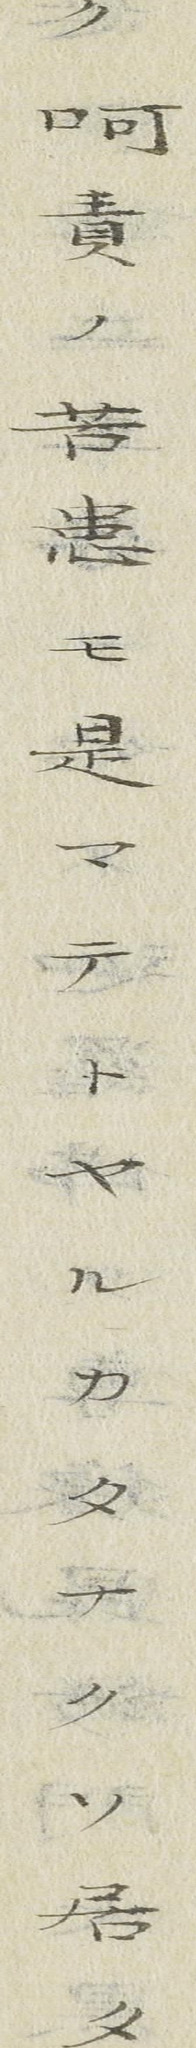ク呵責ノ苦患モ是マテトヤルカタナクソ居タ
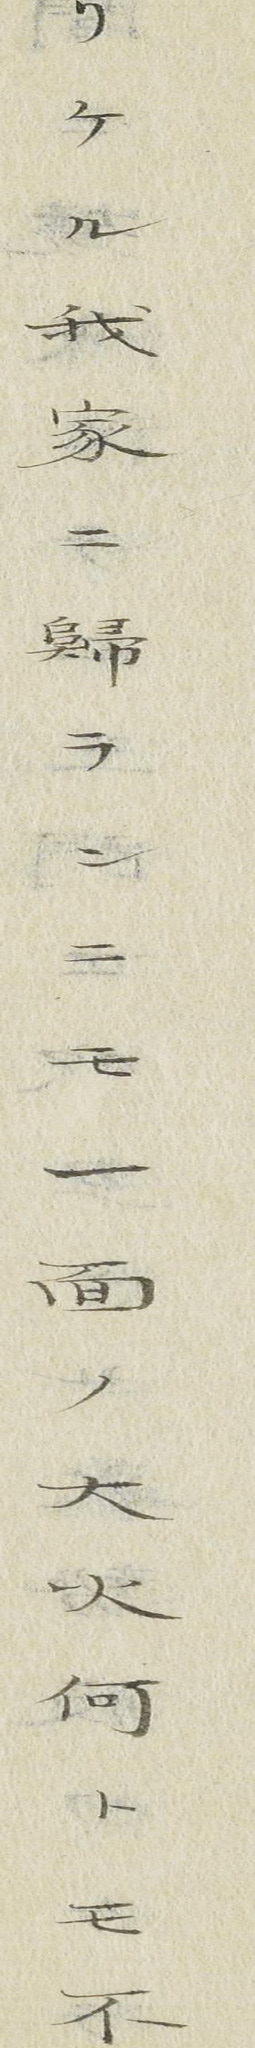リケル我家ニ帰ランニモ一面ノ大火何トモ不
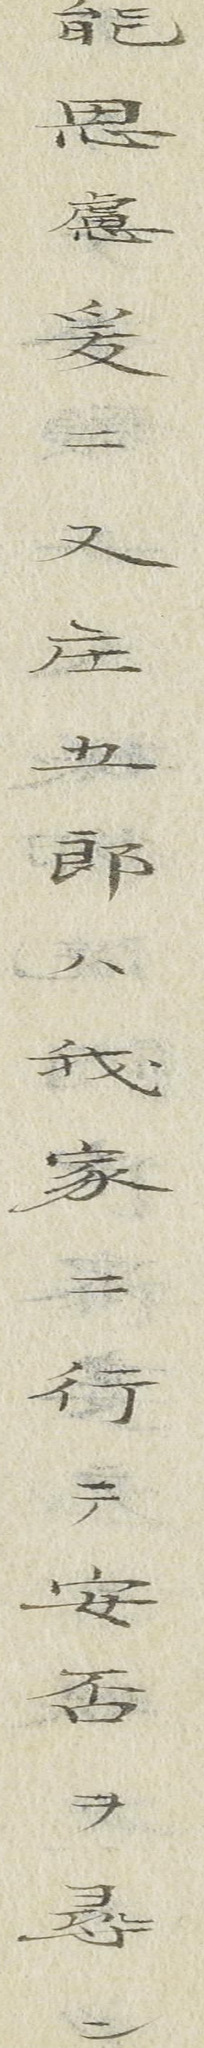能思慮爰ニ又庄五郎ハ我家ニ行テ安否ヲ尋ン
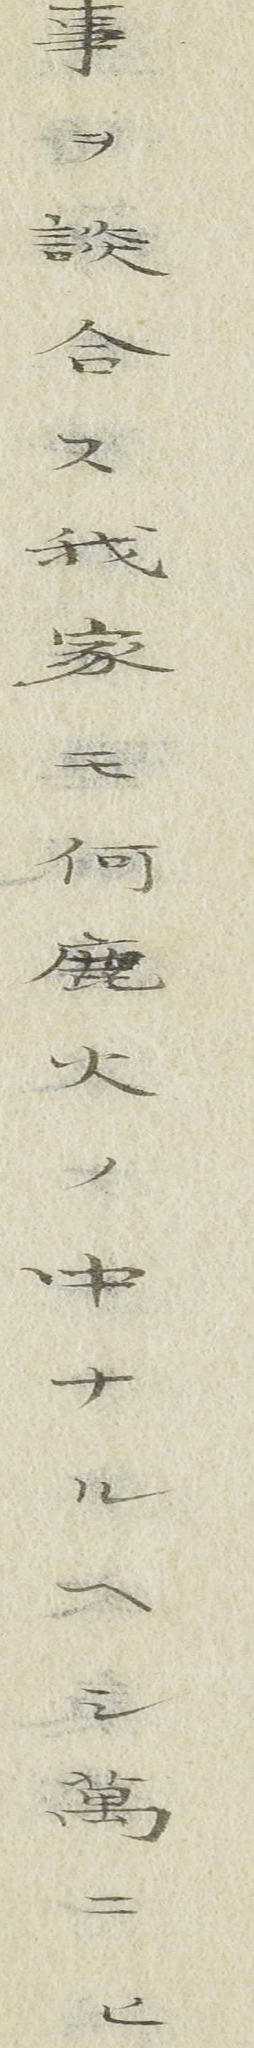事ヲ談合ス我家モ何鹿火ノ中ナルヘシ万ニヒ
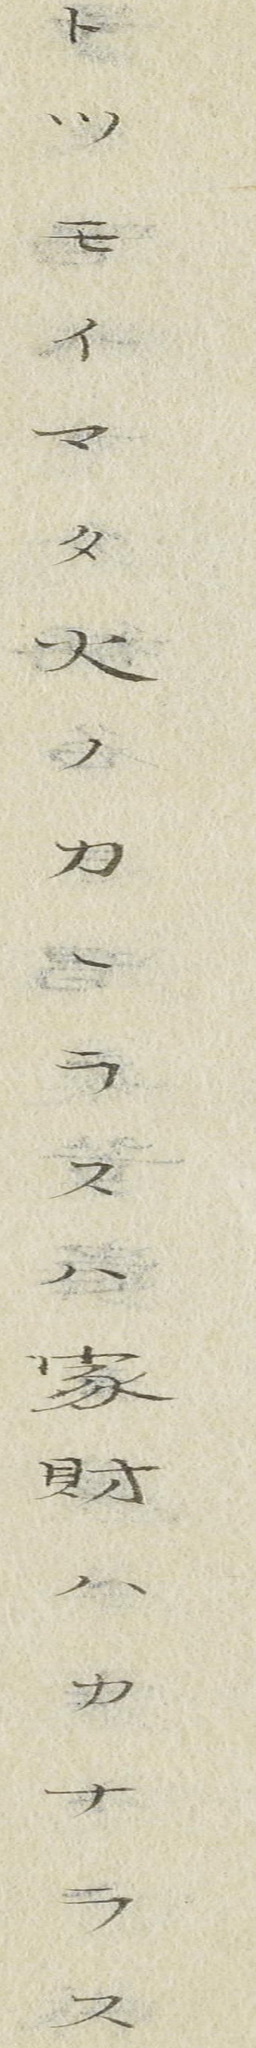トツモイマタ火ノカヽラスハ家財ハカナラス
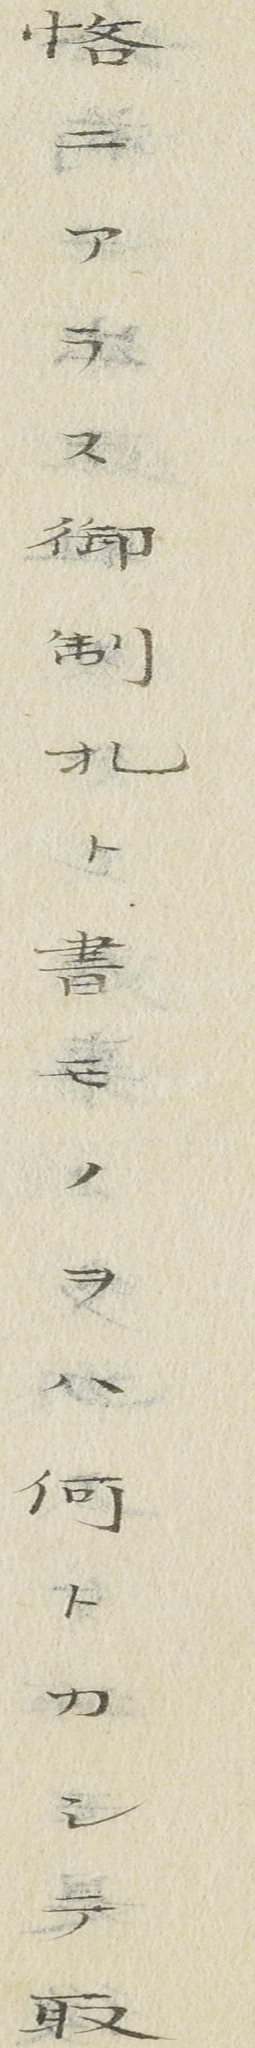悋ニアラス御制札ト書モノヲハ何トカシテ取
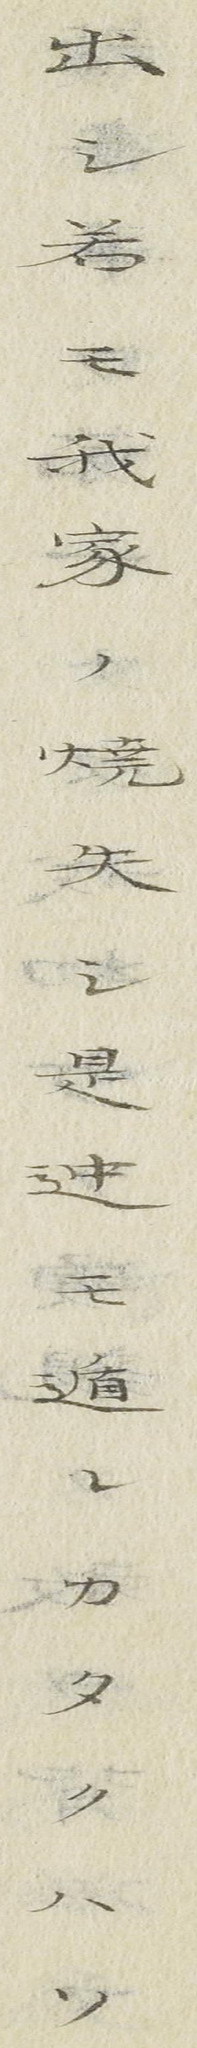出シ若モ我家ノ焼失シ是迚モ遁レカタクハソ
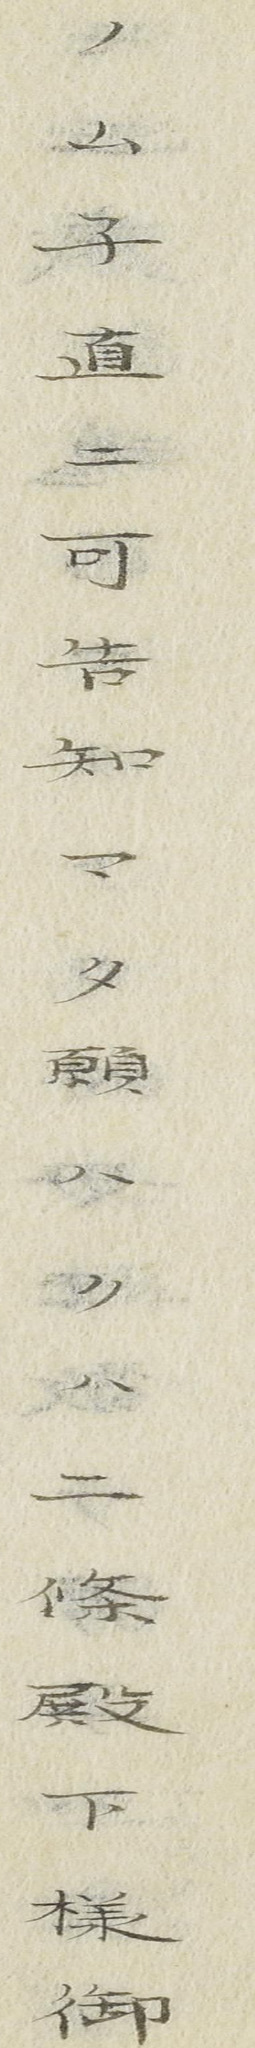ノム子直ニ可告知マタ願ハクハ二條殿下様御
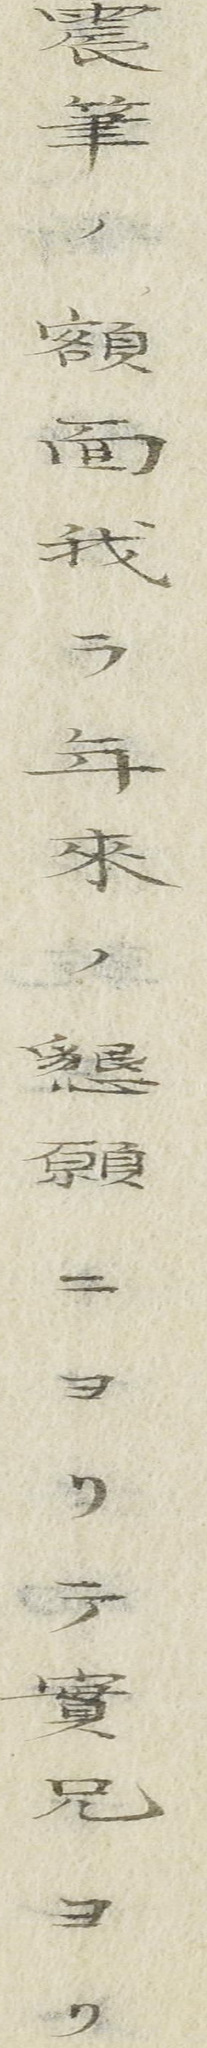震筆ノ額面我ラ年来ノ懇願ニヨリテ実兄ヨリ
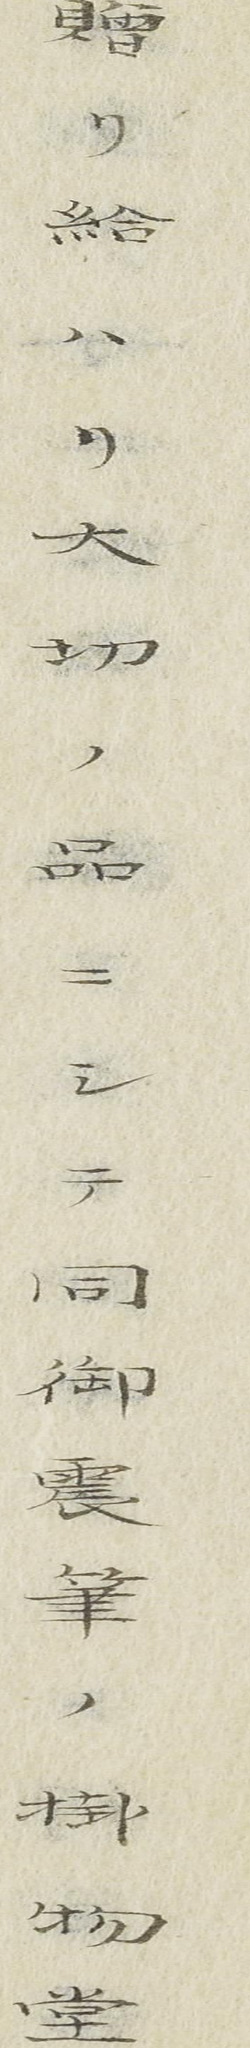贈リ給ハリ大切ノ品ニシテ同御震筆ノ掛物堂
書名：地災撮要　地震之部　巻ノ二
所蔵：東京大学地震研究所図書室 Earthquake Research Institute Library, The University of Tokyo, JAPAN
